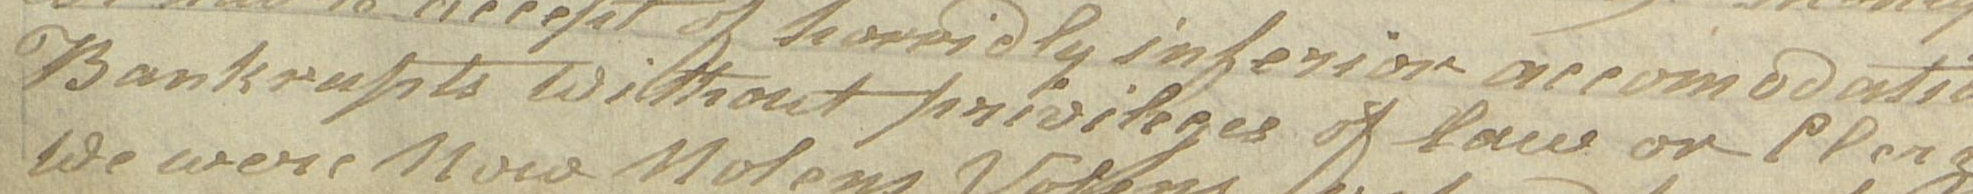Bankrupts without privileges of law or Clergy
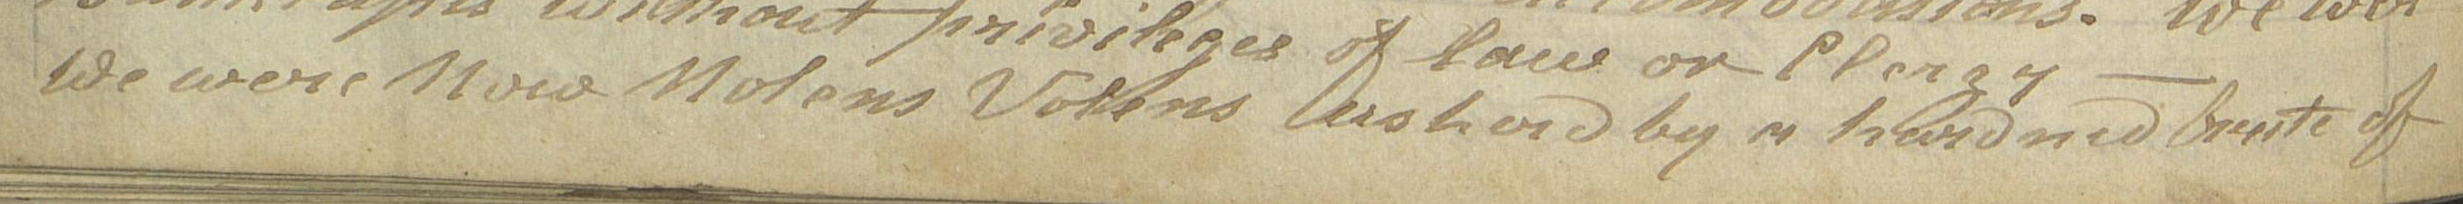We were Now Molens Volens usherd by a hardned brute of
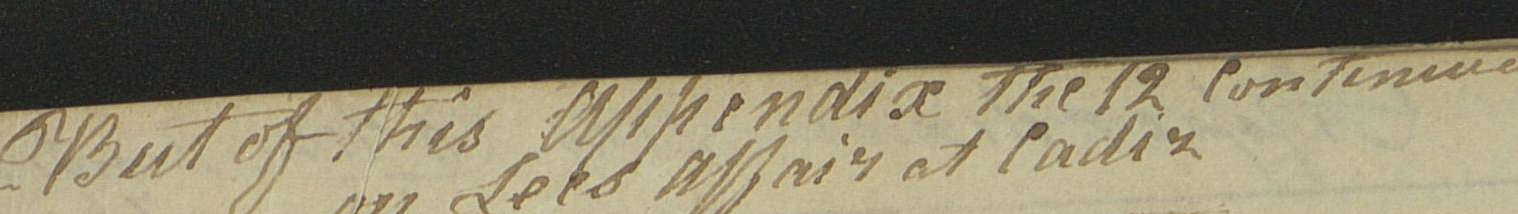But of this Appendix the 12 Continued
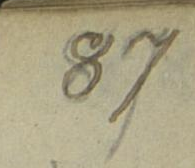87
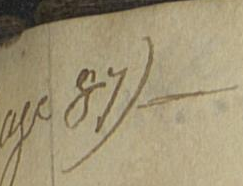page 87)
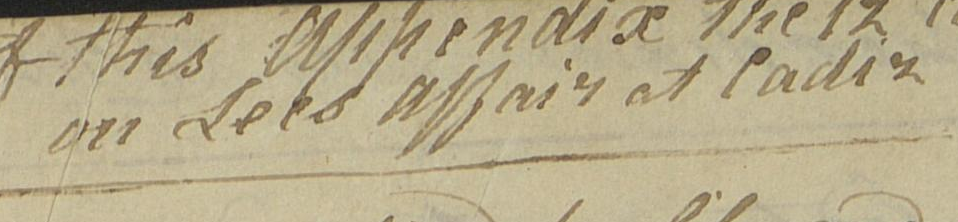on Lees Affair at Cadiz
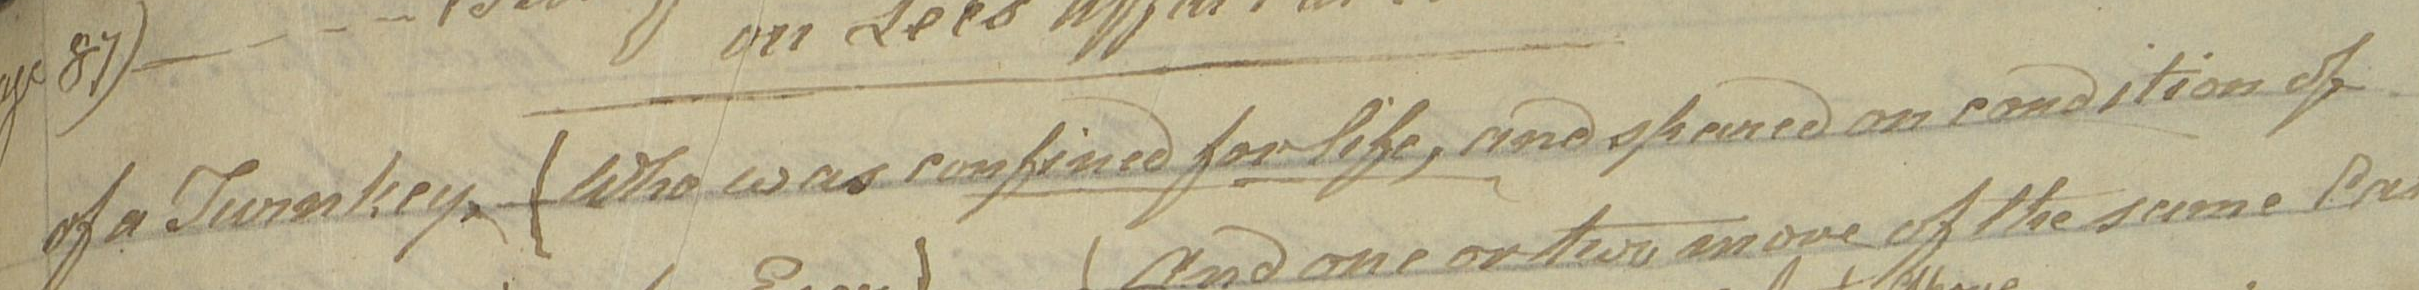of a Turnkey (Who was confined for life, and spared on condition of
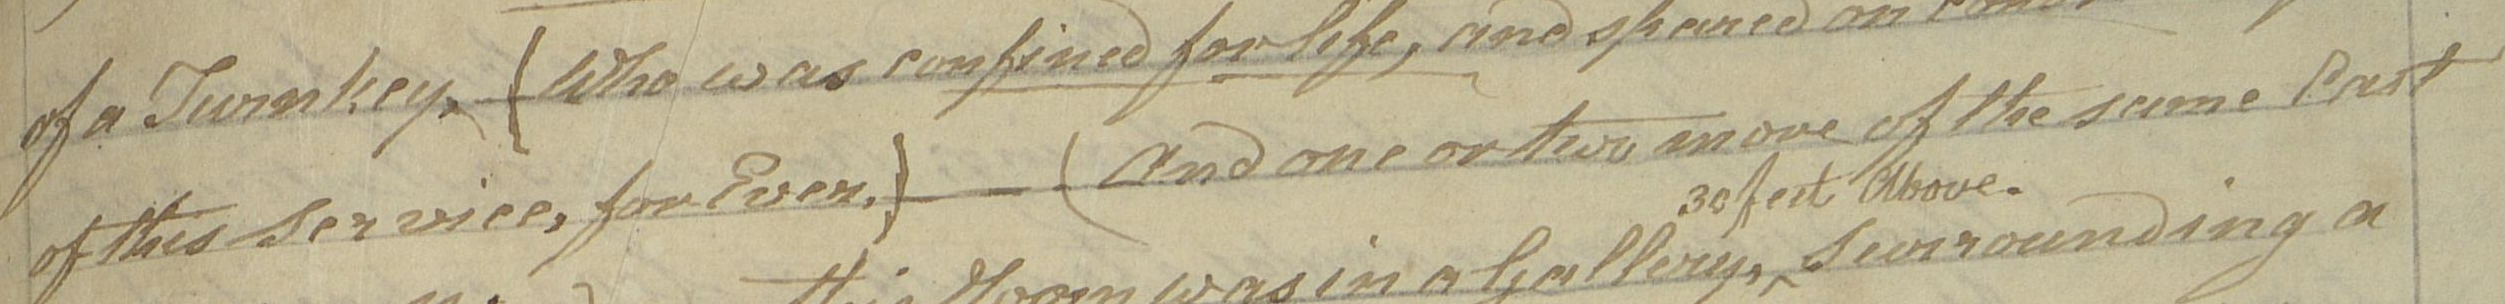of this service, for Ever) (And one or two more of the same Cast
